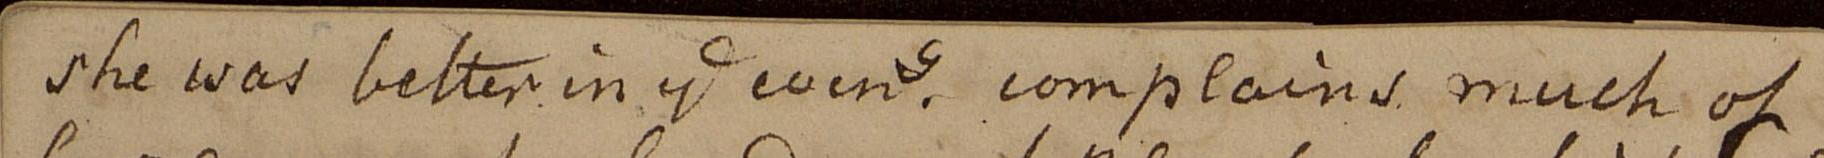she was better in y^e even^g. complains much of
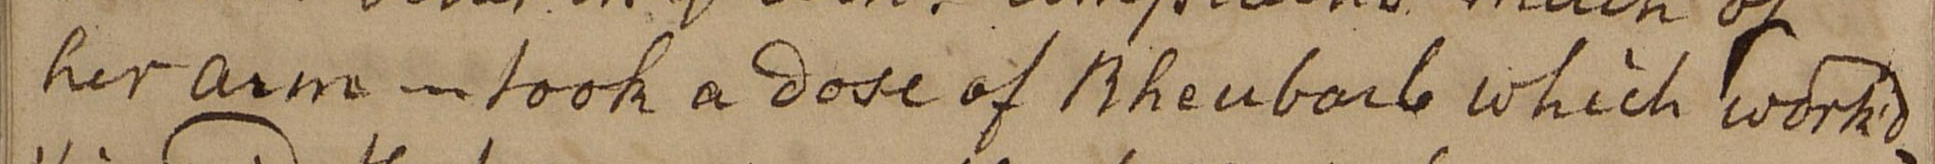her arm- took a dose of Rheubarb which work'd
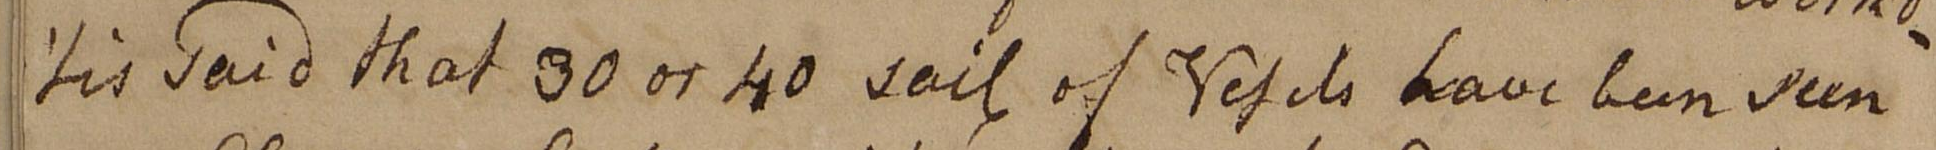'tis said that 30 or 40 sail of Vesels have been seen
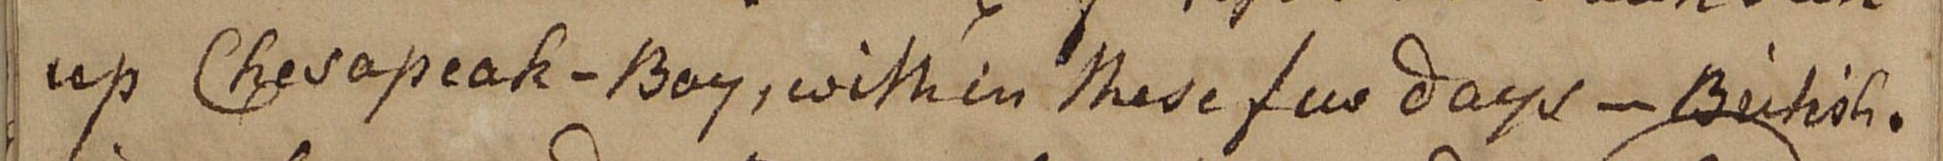up Chesapeak-Bay, with in these few days- British.
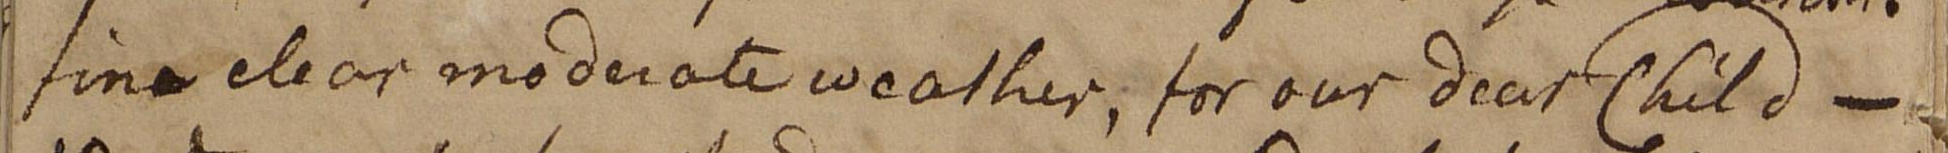fine clear moderate weather, for our dear Child-
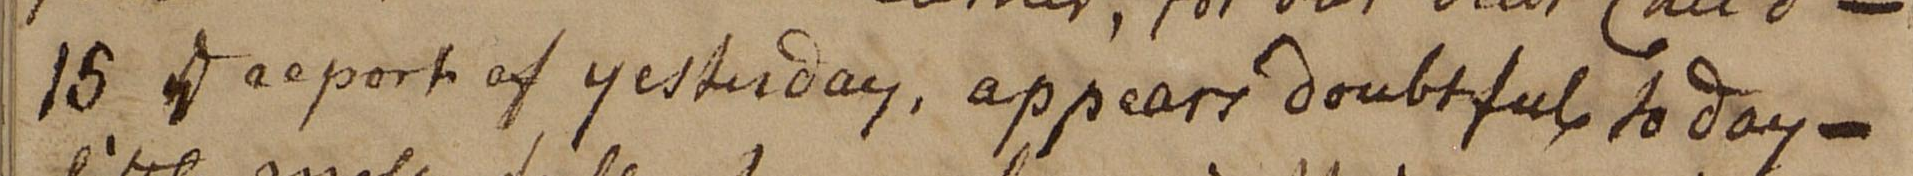15 y^e report of yesterday, appears doubtful to day-
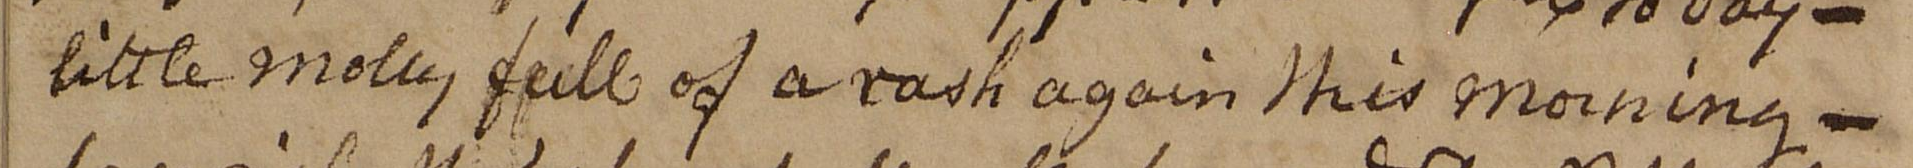little Molly full of a rash again this morning-
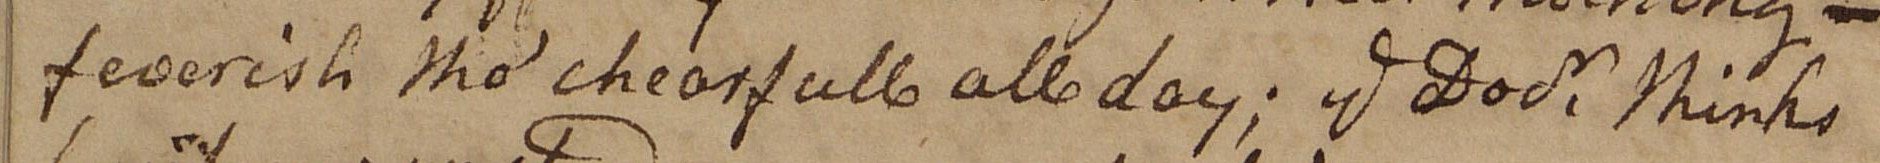feverish tho' chearfull all day; y^e Doc^r. thinks
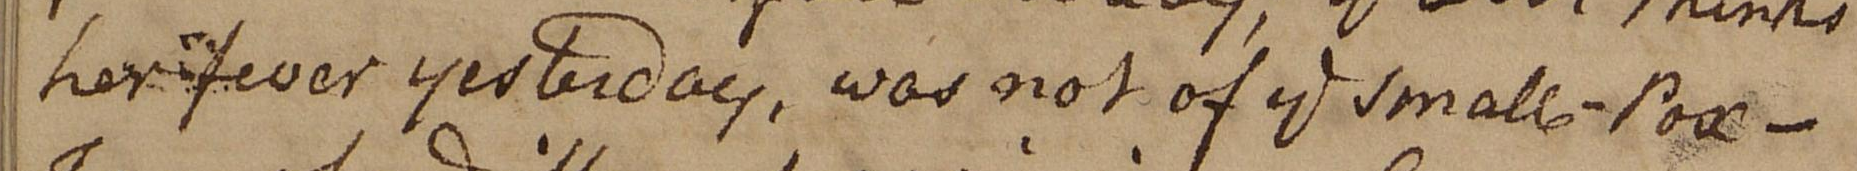her fever yesterday, was not of y^e Small-Pox-
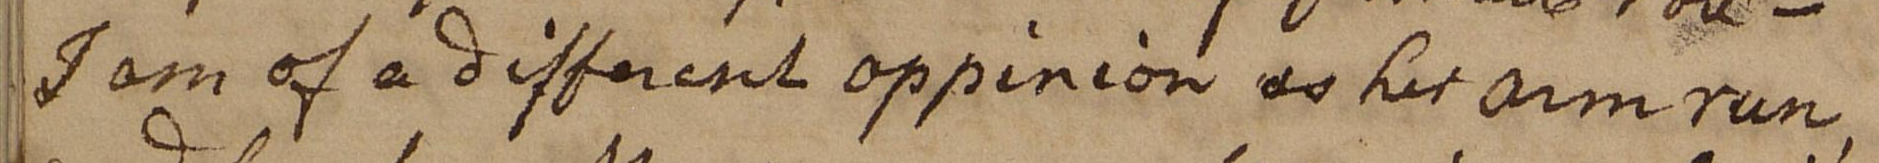I am of a different oppinion as her arm run,
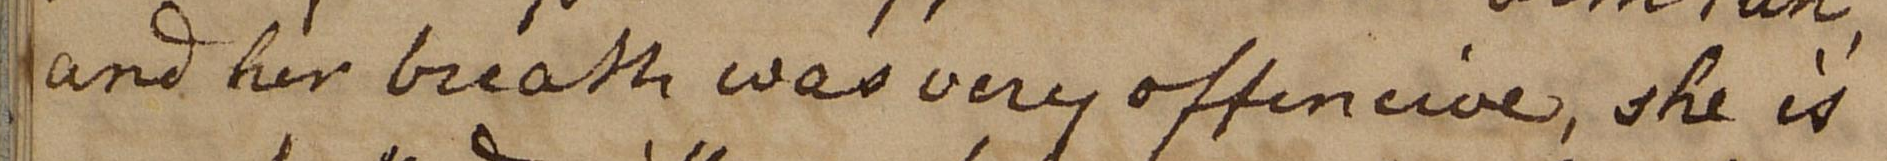and her breath was very offencive, she is
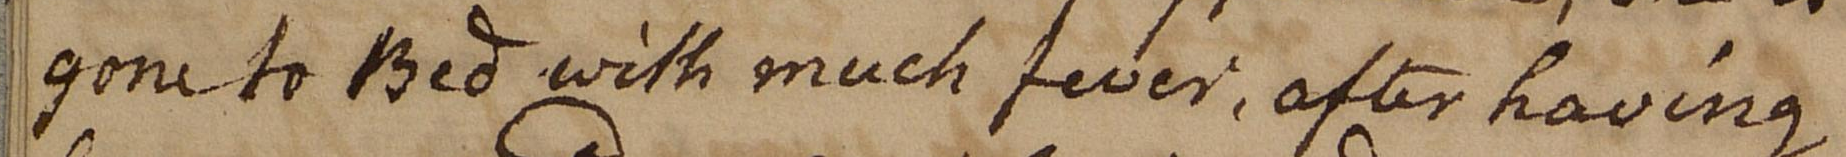gone to Bed with much fever, after having
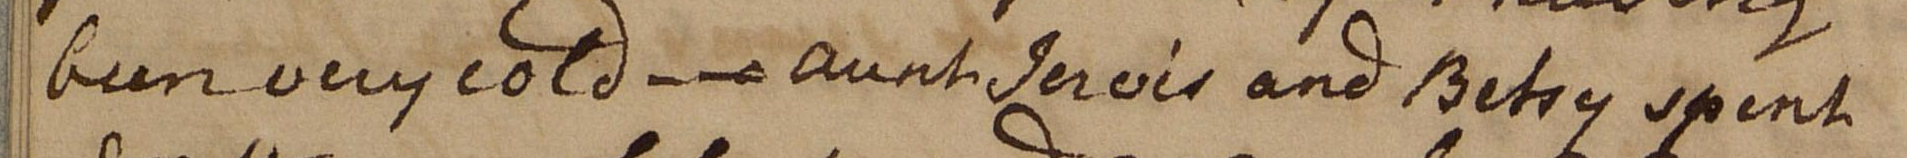been very cold- Aunt Jervis and Betsy spent
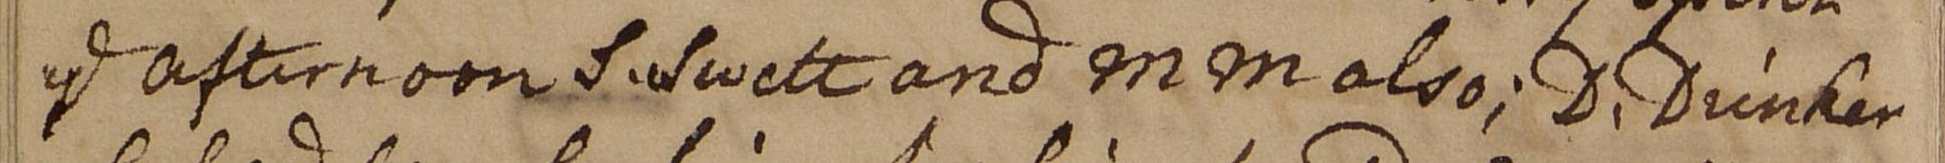y^e afternoon S Swett and M M also; D. Drinker
